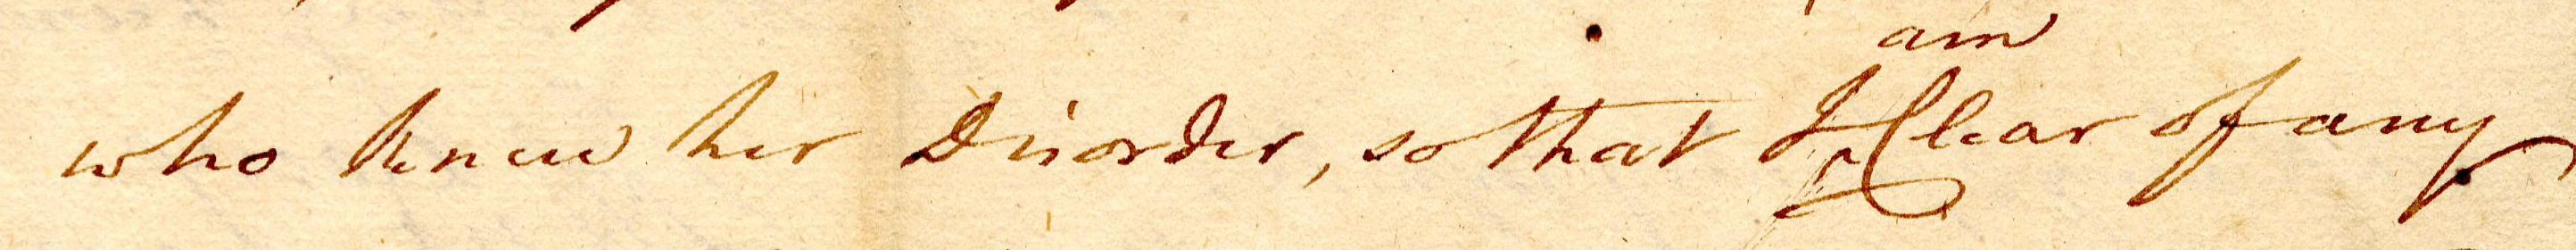who knew her Disorder, so that I ^ Clear of any
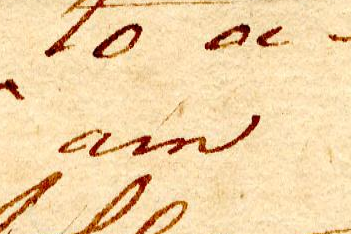am
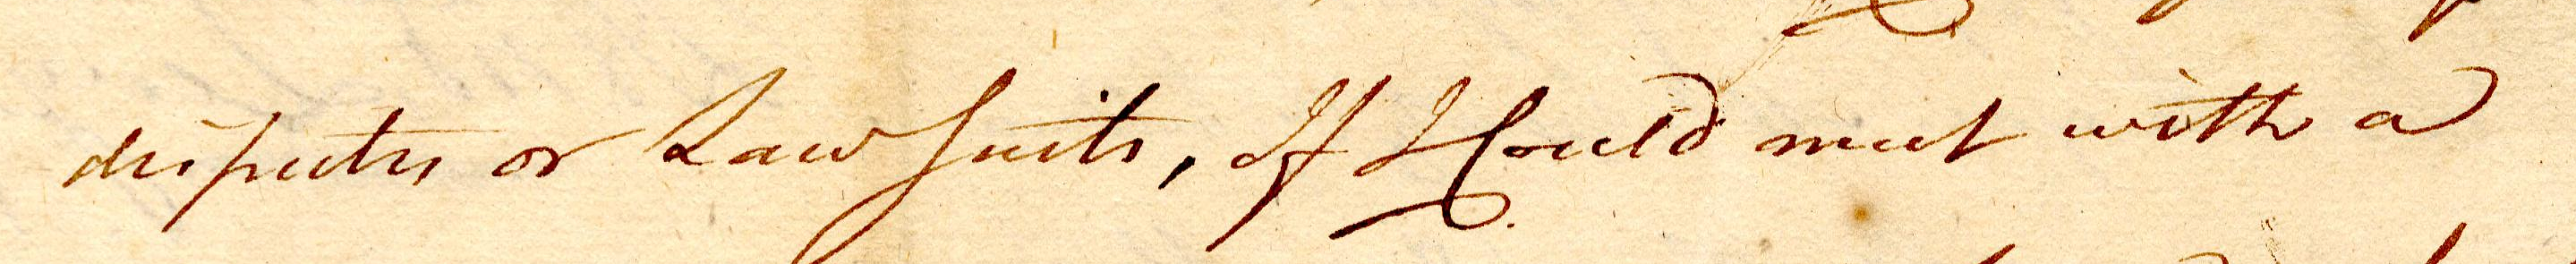disputes or Law suits, If I Could meet with a
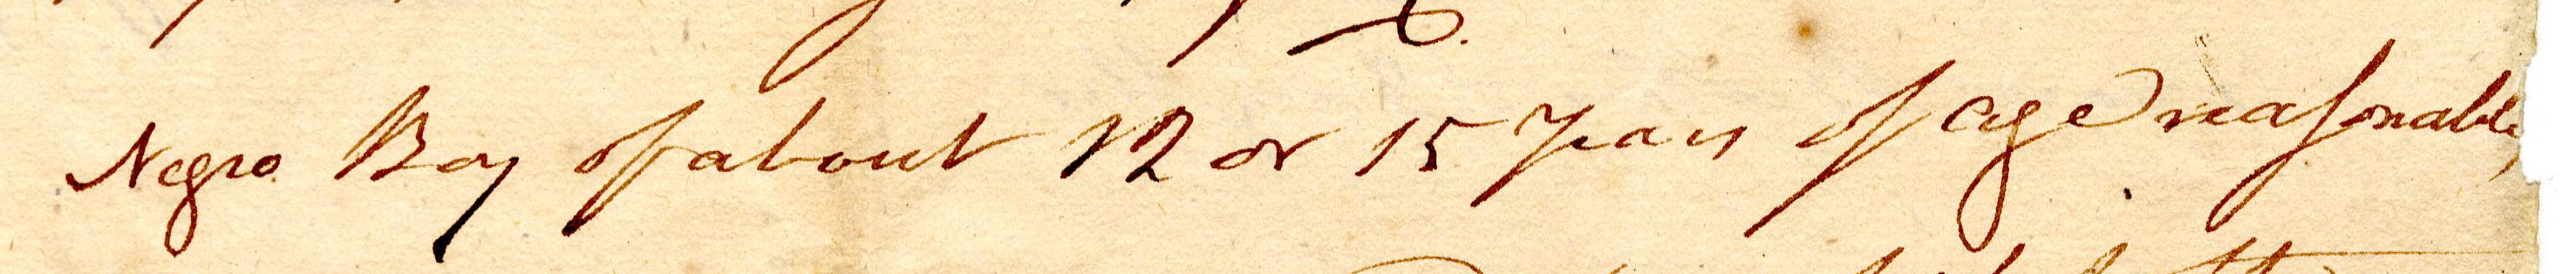Negro boy of about 12 or 15 years of age reasonable
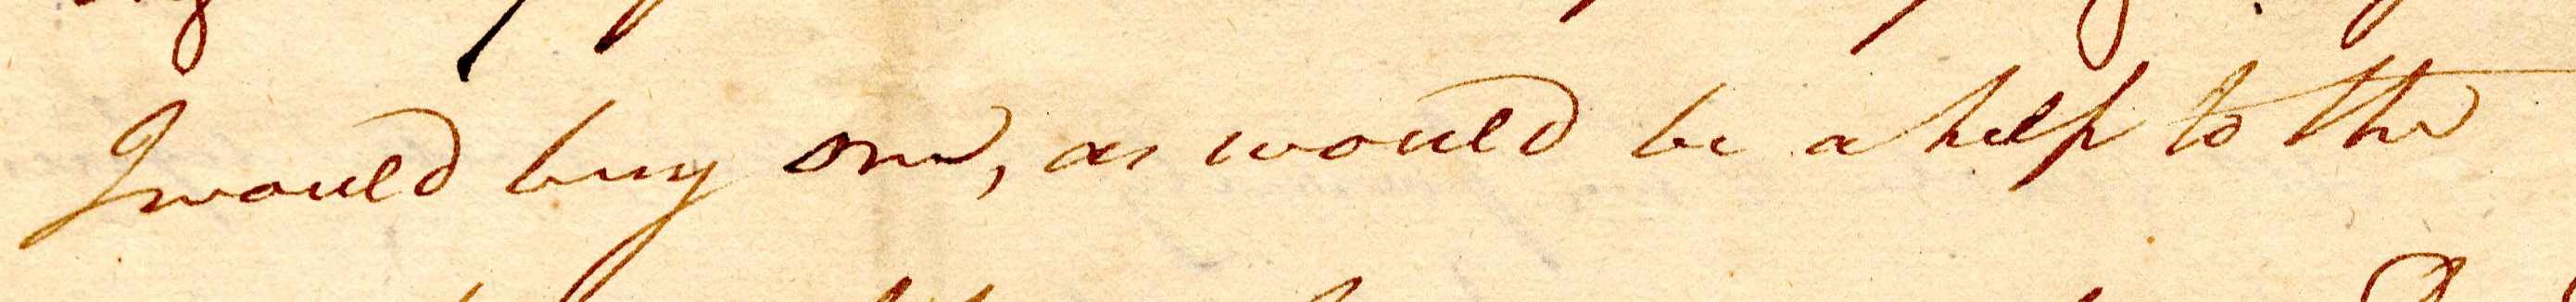I would buy one, as would be a help to the
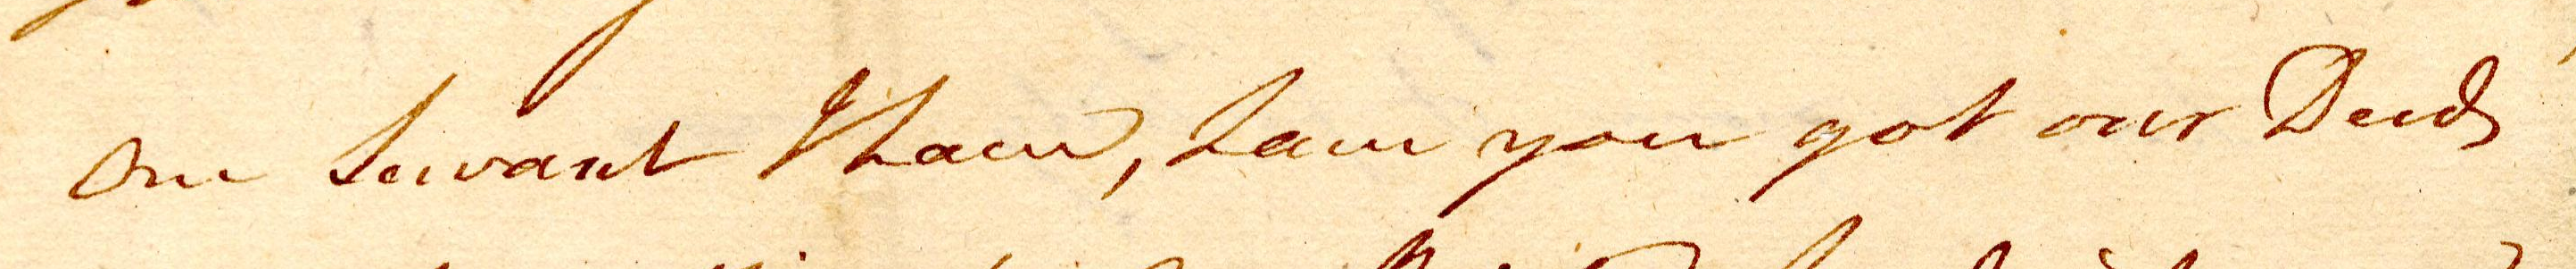one Servant I have, have you got our Deed
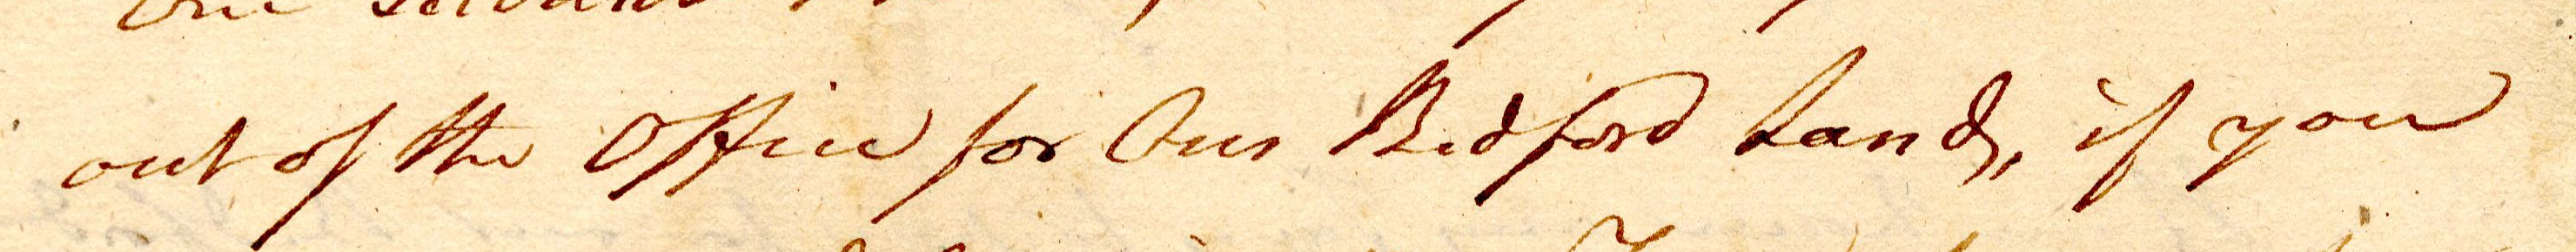out of the Office for Our Bedford Lands, if you
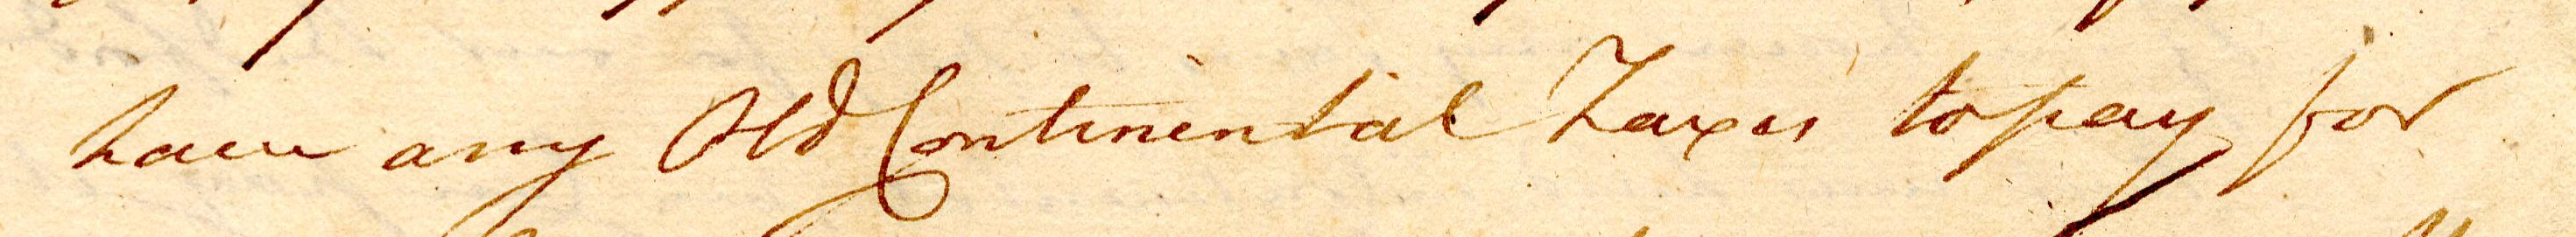have any Old Continental Taxes to pay for
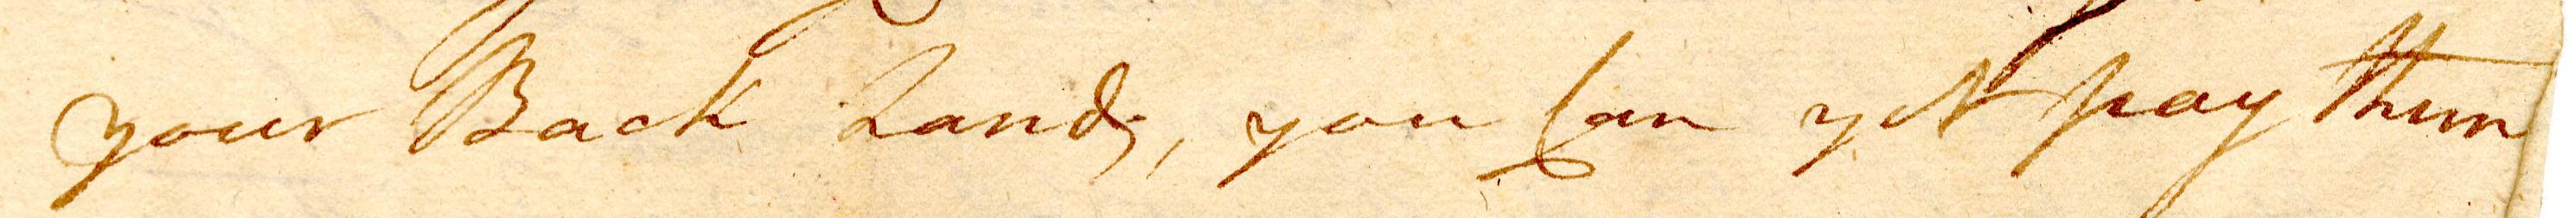your Back Land, you Can yet pay them
